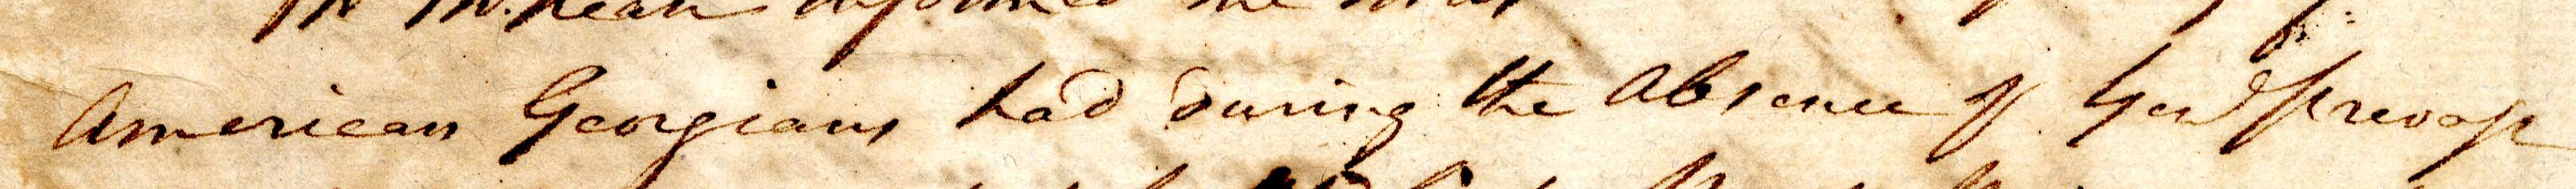American Georgians had during the Absence of Gen^l Prevoss
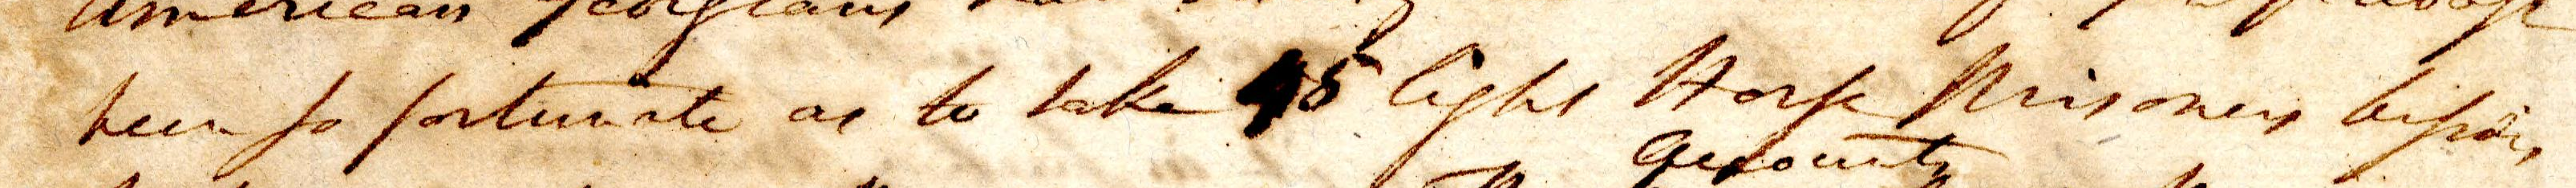been so fortunate as to take 18 light Horse prisoners before
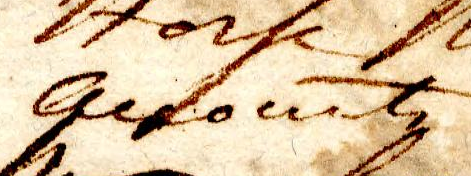Accounts
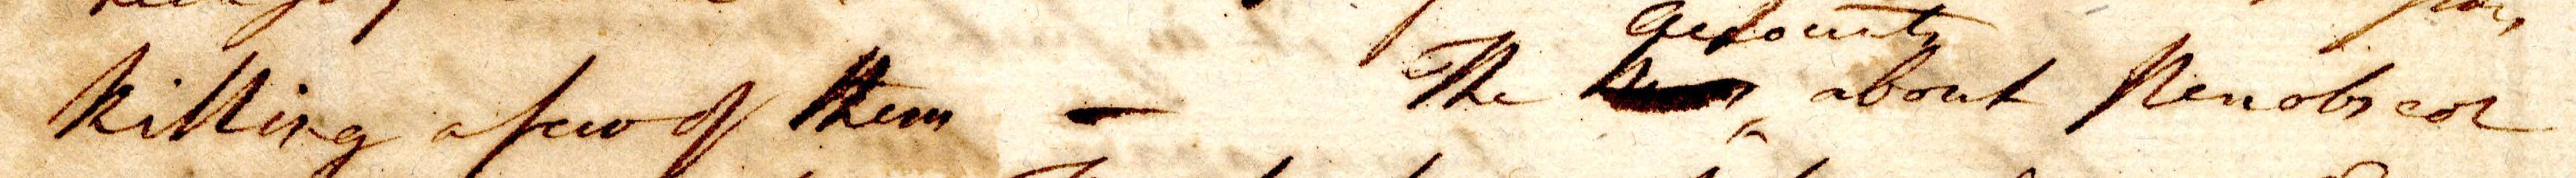killing a few of them. The [__]^ about penobscor
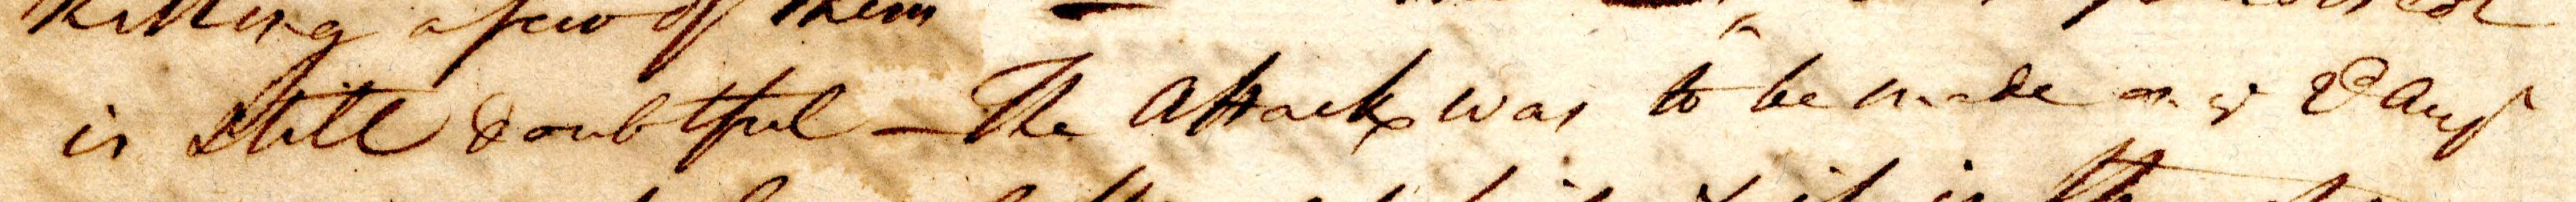is still doubtful. The Attack was to be made on y^e 2^d Aug^t
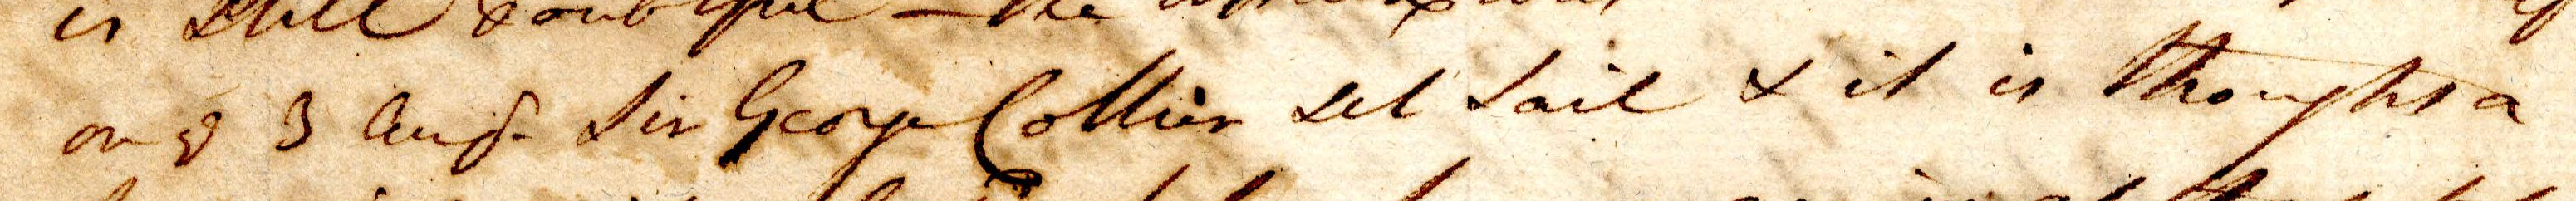or y^e 3 Aug^.t Sir George Collier set sail & it is thought a
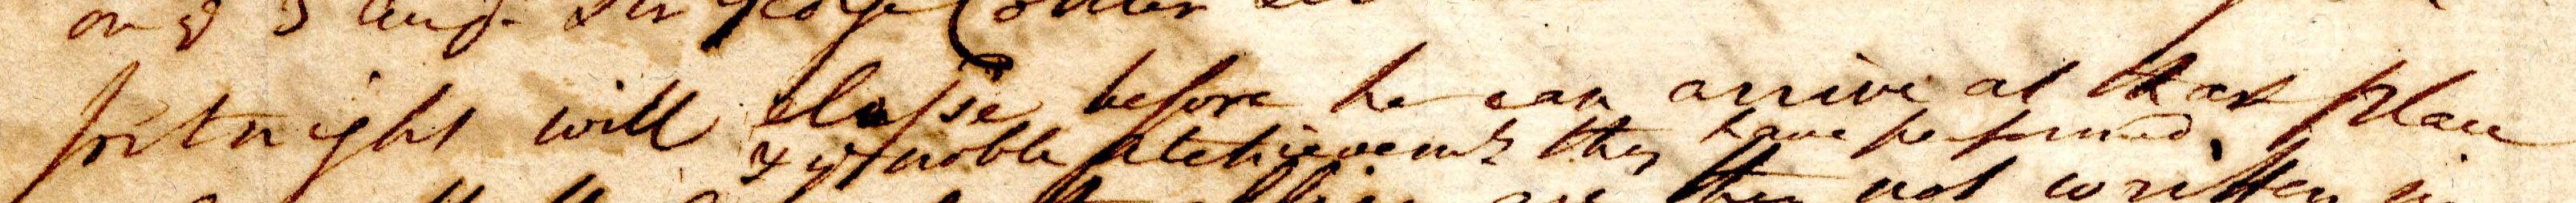fortnight will elapse before he can arrive at the place
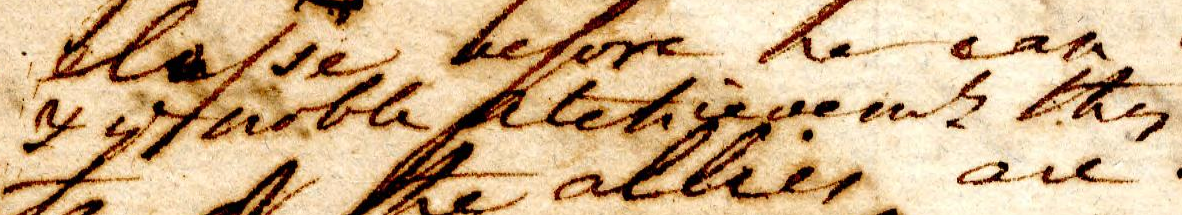& y^e noble atetieceems they
